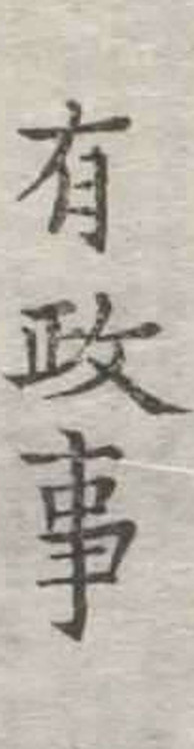有政事
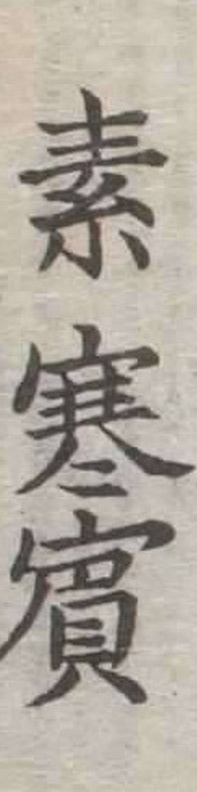素寒賓
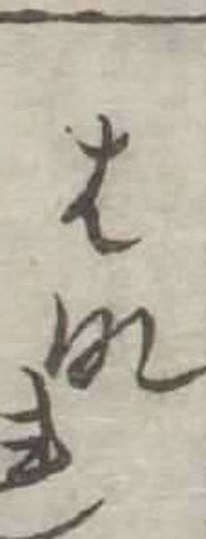はなれ

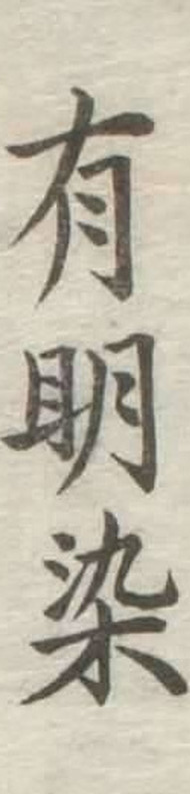有明染
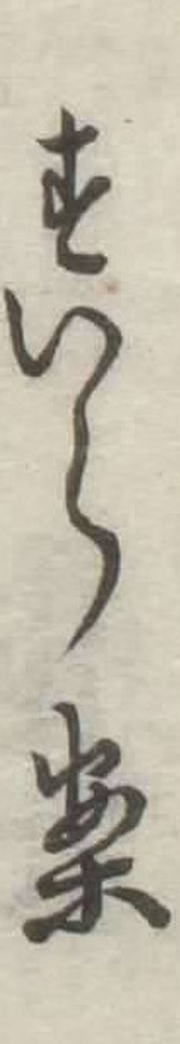すいら案
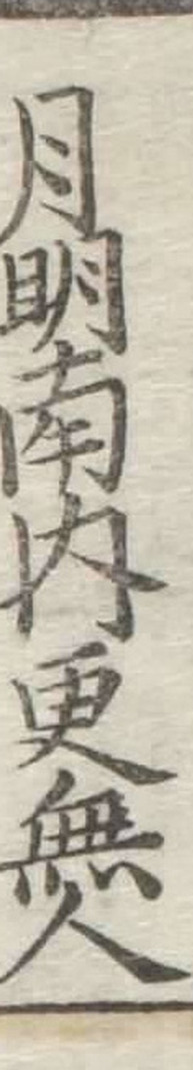月明南内更無人
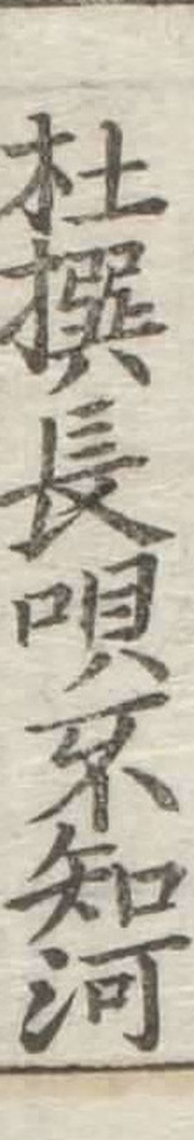杜撰長唄不知河
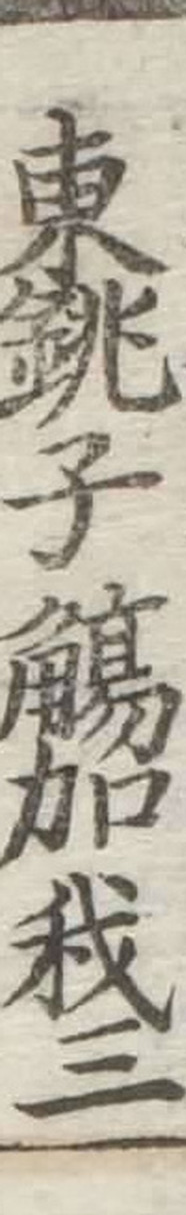東銚子觴加我三
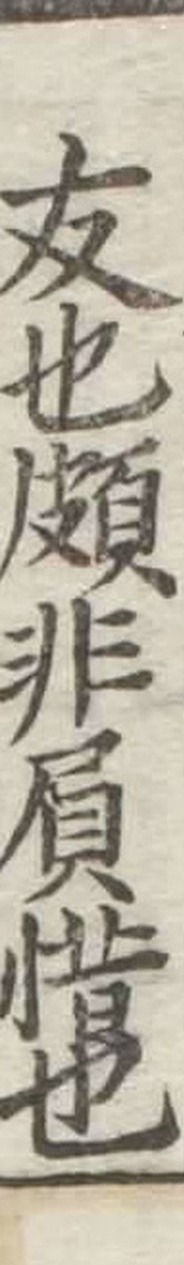友也頗非負惜也
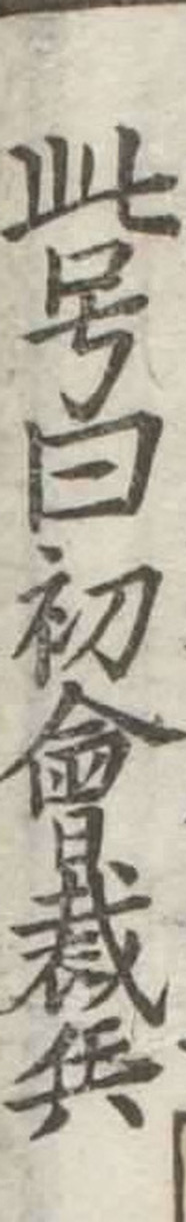此号曰初会裁凭
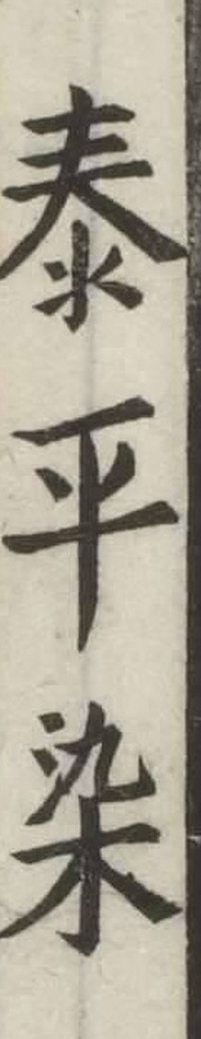泰平染
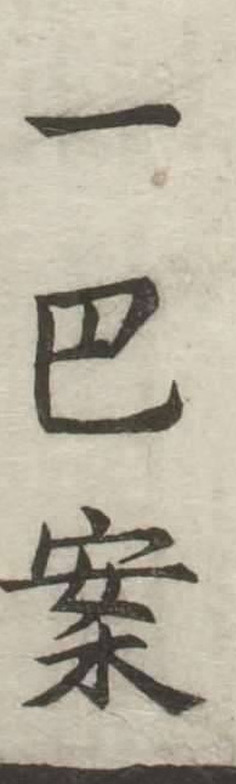一巴案
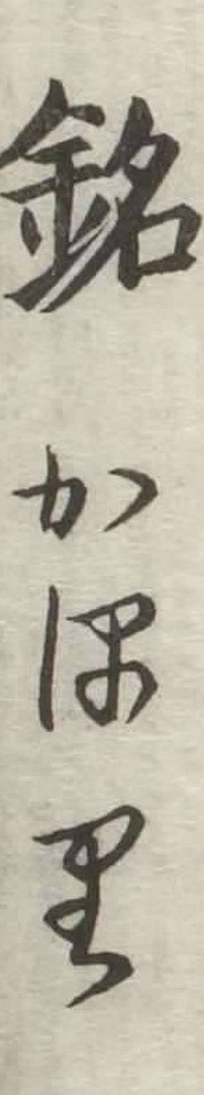銘かほり
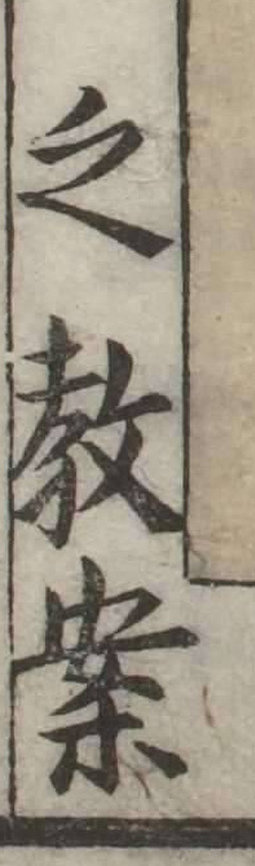之教案

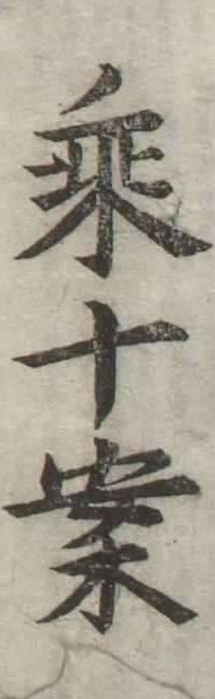乗十案
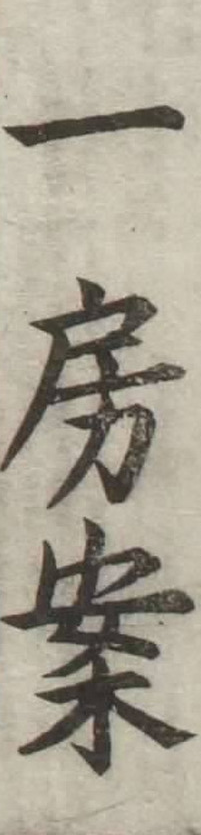一房案
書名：たなくひあわせ
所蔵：国文学研究資料館
